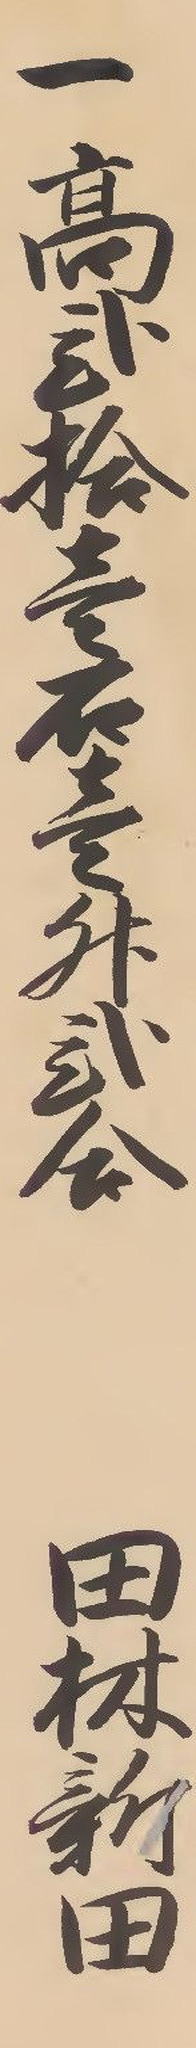一高弐拾壱石壱升弐合田林新田

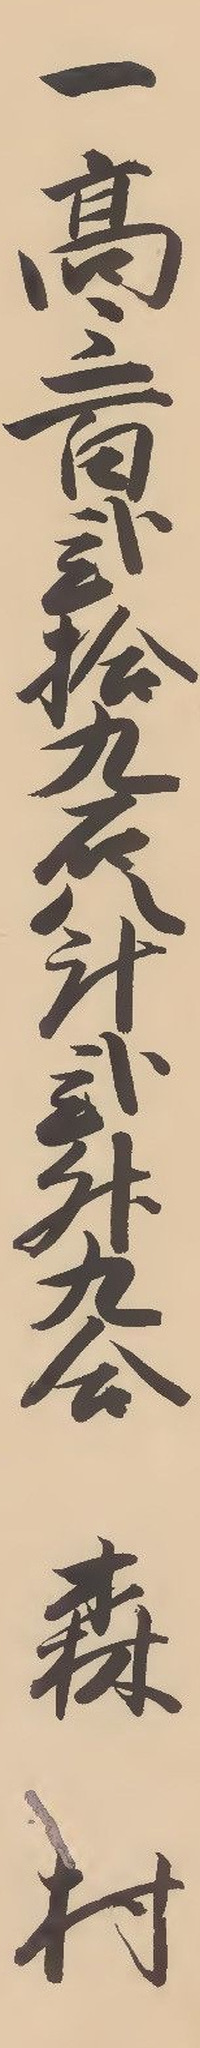一高三百弐拾九石八斗弐升九合森村
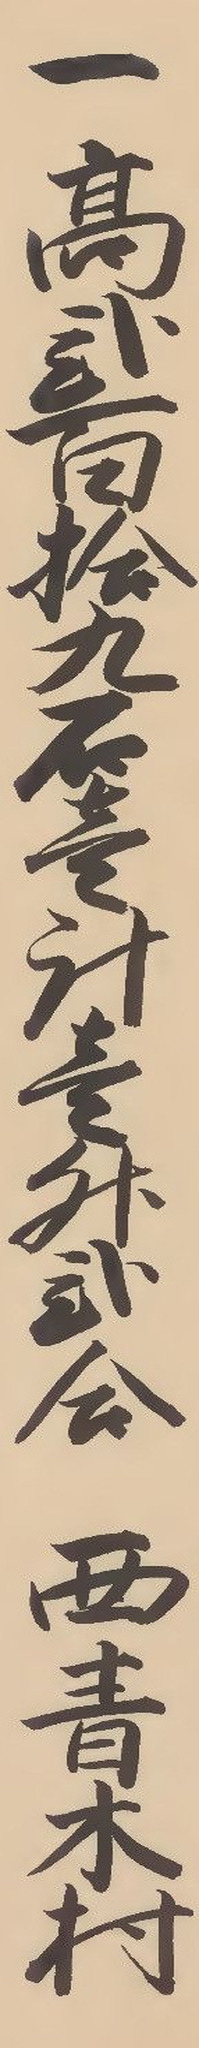一高弍百拾九石壱斗壱升弐合西青木村
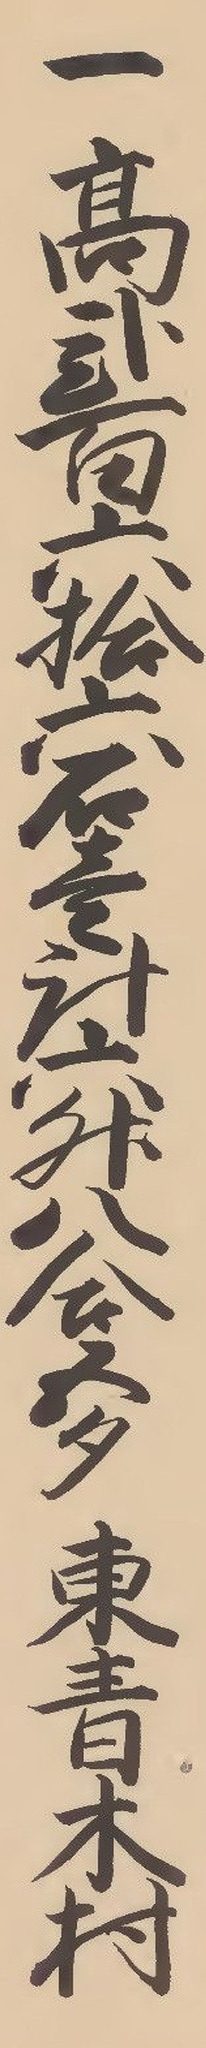一高弍百六拾六石壱斗六升八合五勺東青木村
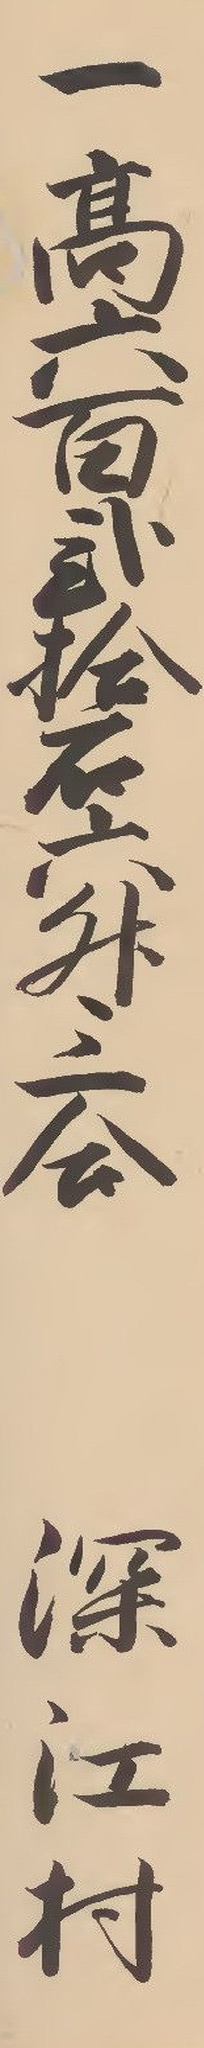一高六百弐拾石六升三合深江村
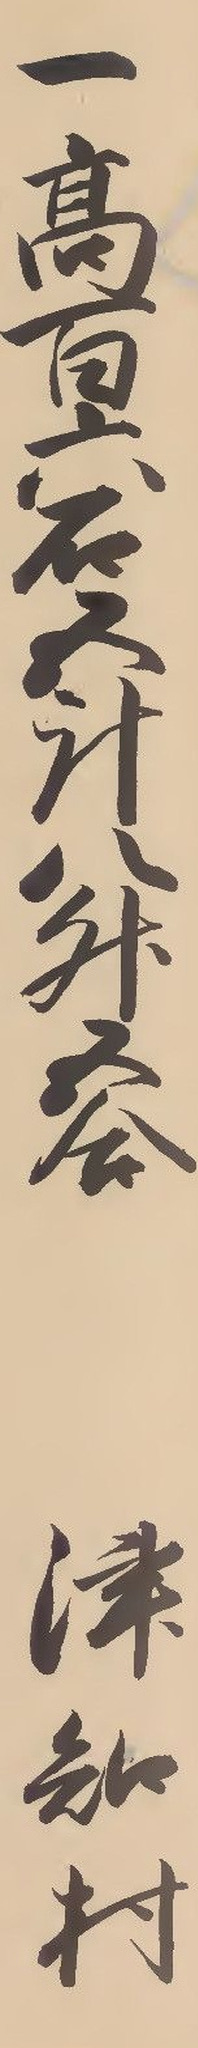一高百六石五斗八升五合津知村
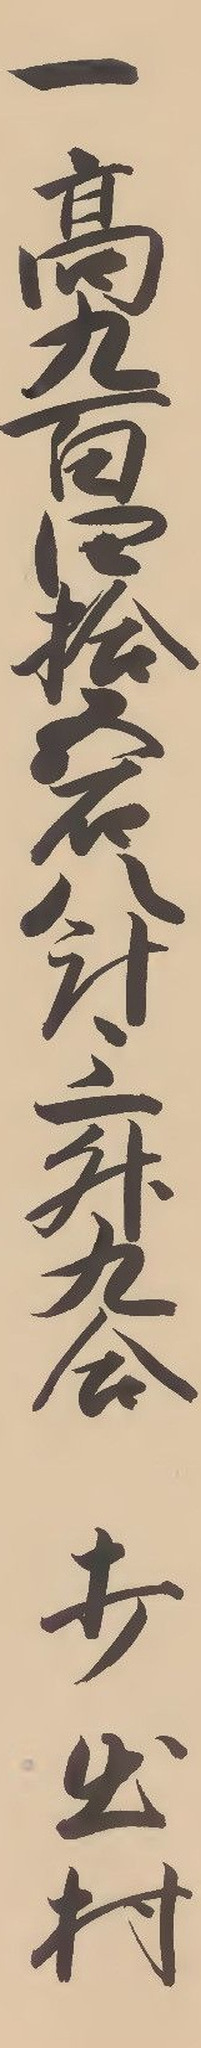一高九百四拾五石八斗三升九合打出村
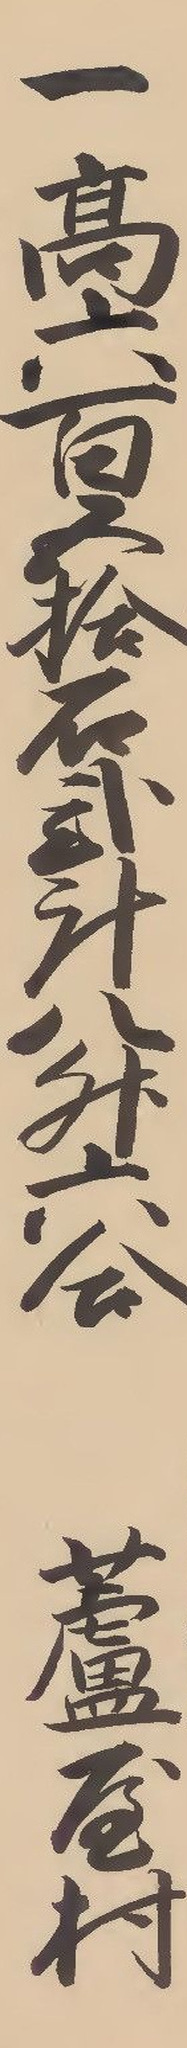一高六百五拾石弐斗八升六合蘆屋村

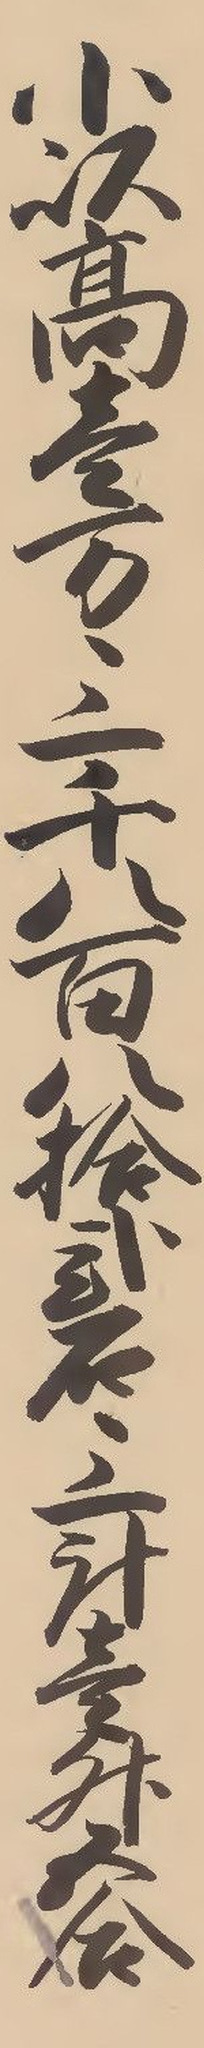小以高壱万三千八百八拾弐石三斗壱升五合
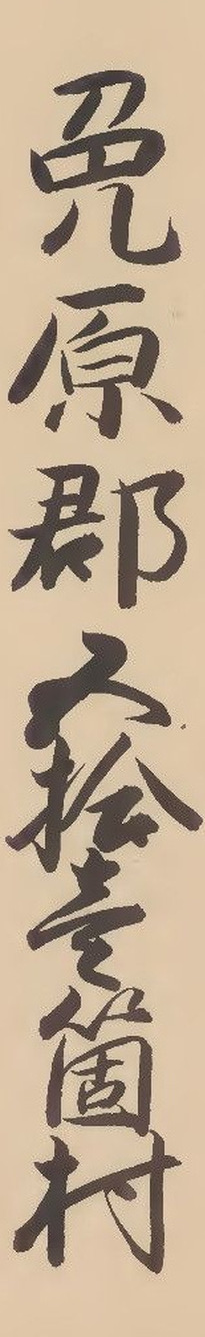兎原郡五拾壱箇村
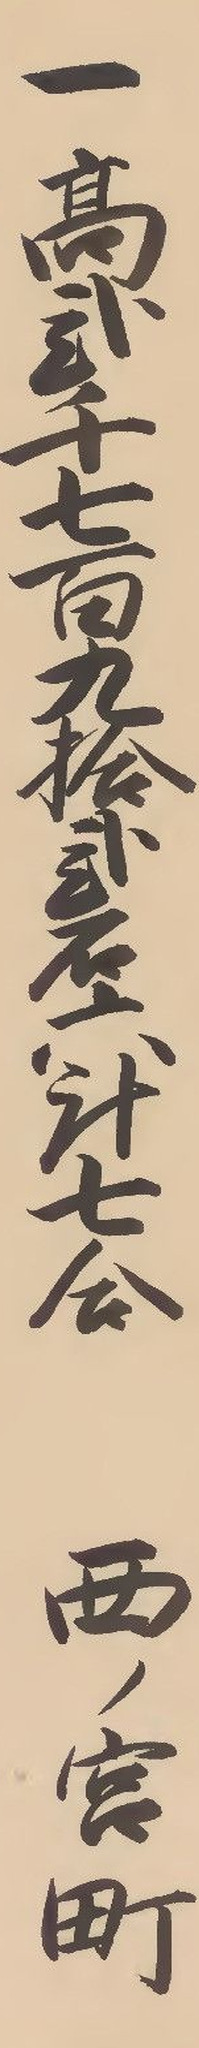一高弐千七百九拾弐石六斗七合西ノ宮町
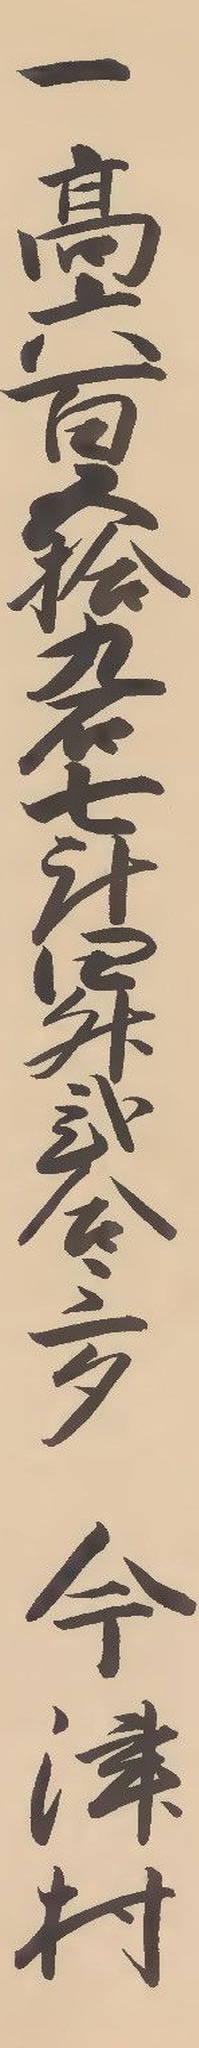一高六百五拾九石七斗四升弐合三勺今津村
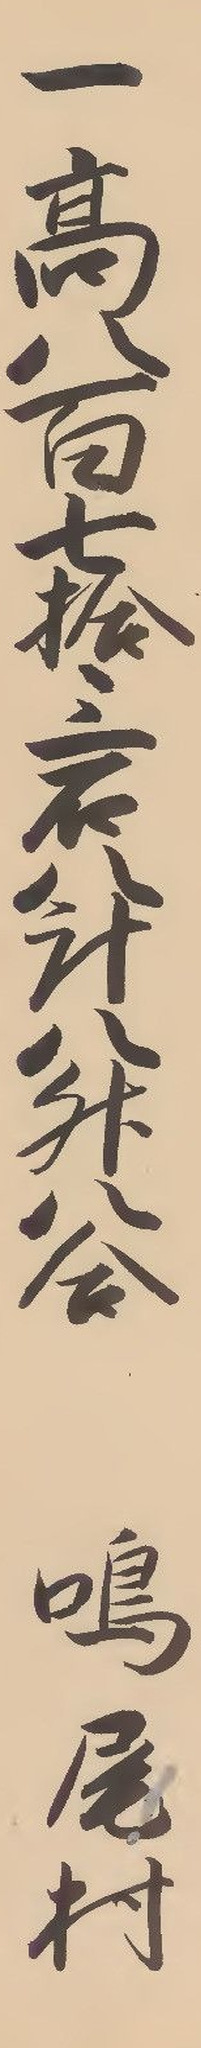一高八百七拾三石八斗八升八合鳴尾村

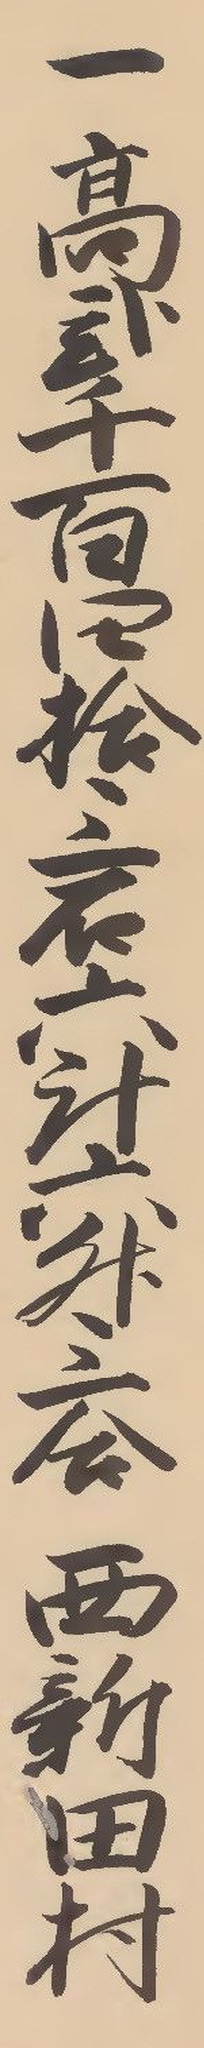一高弐千百四拾三石六斗六升三合西新田村
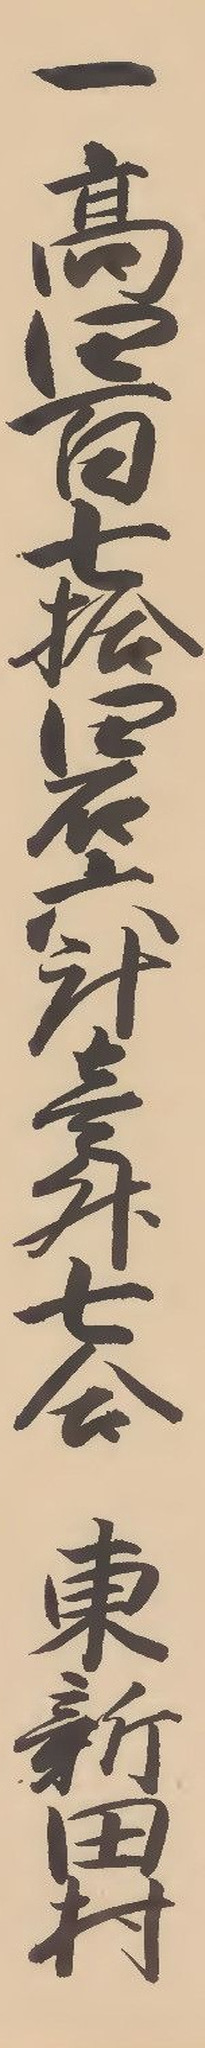一高四百七拾四石六斗壱升七合東新田村
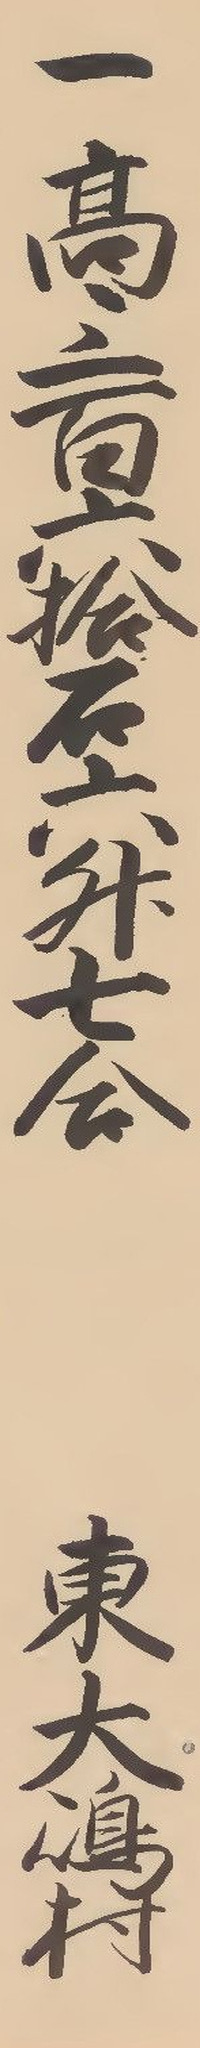一高三百六拾石六升七合東大島村
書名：摂津国郷帳
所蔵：国立公文書館 National Archives of Japan
